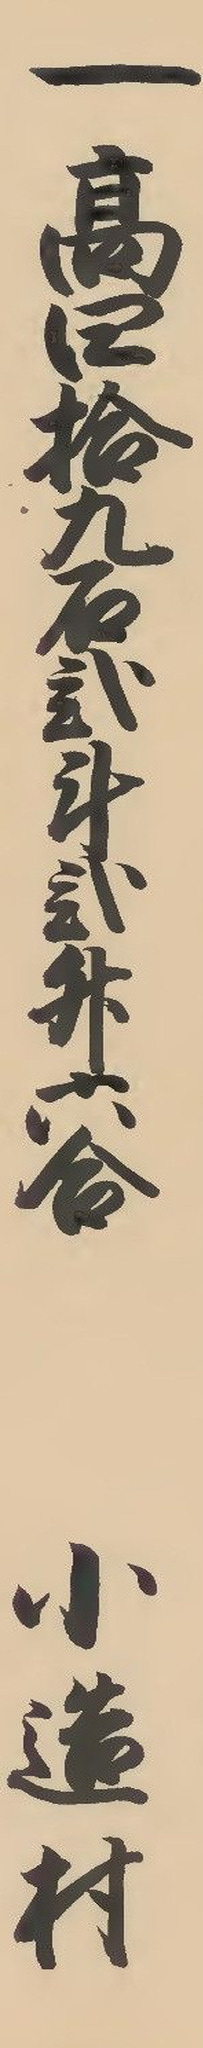一高四拾九石弐斗弐升六合小造村
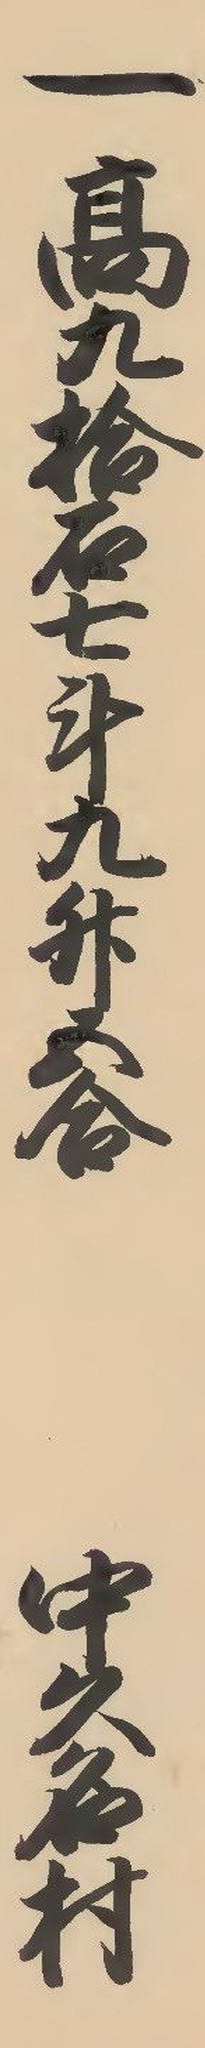一高九拾石七斗九升五合中久名村
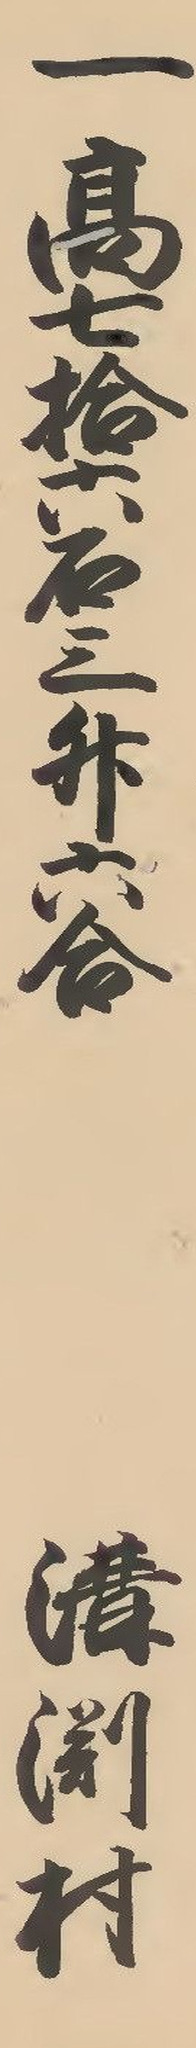一高七拾六石三升六合溝淵村
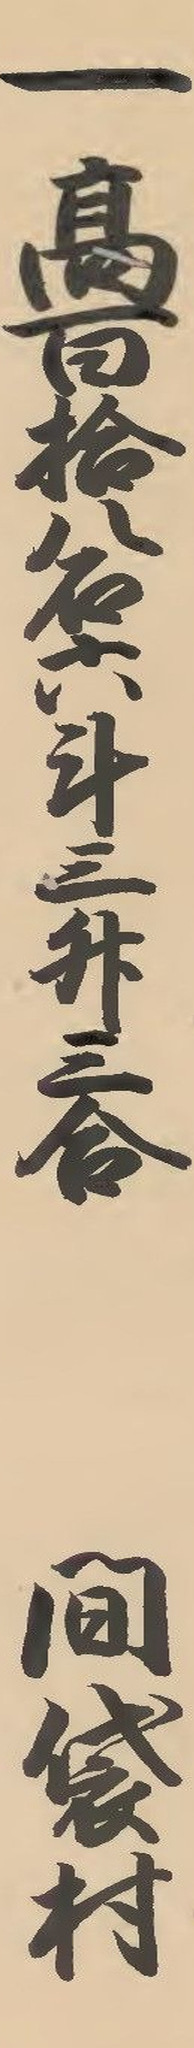一高百拾八石六斗三升三合間袋村
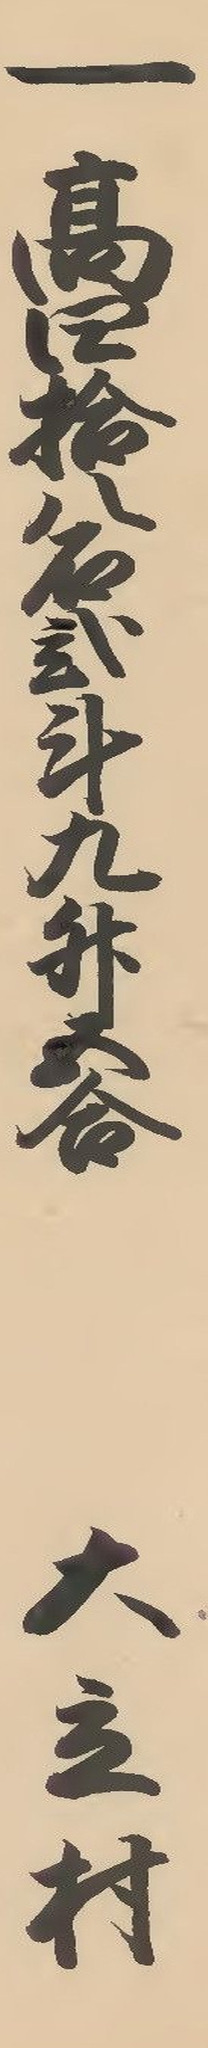一高四拾八石弐斗九升五合大立村
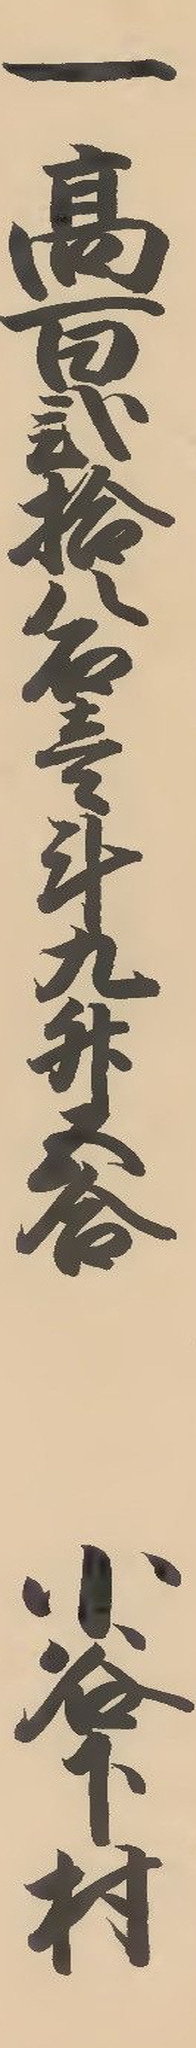一高百弐拾八石壱斗九升五合小谷下村
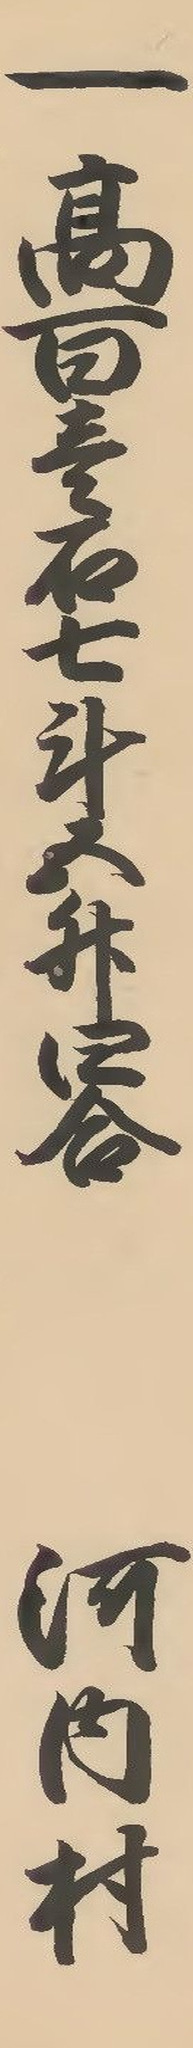一高百壱石七斗五升四合河内村

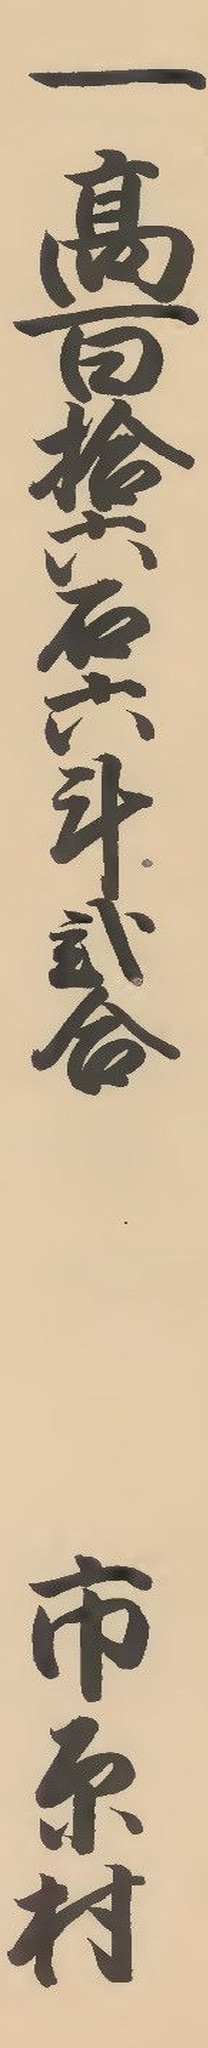一高百拾六石六斗弐合市原村
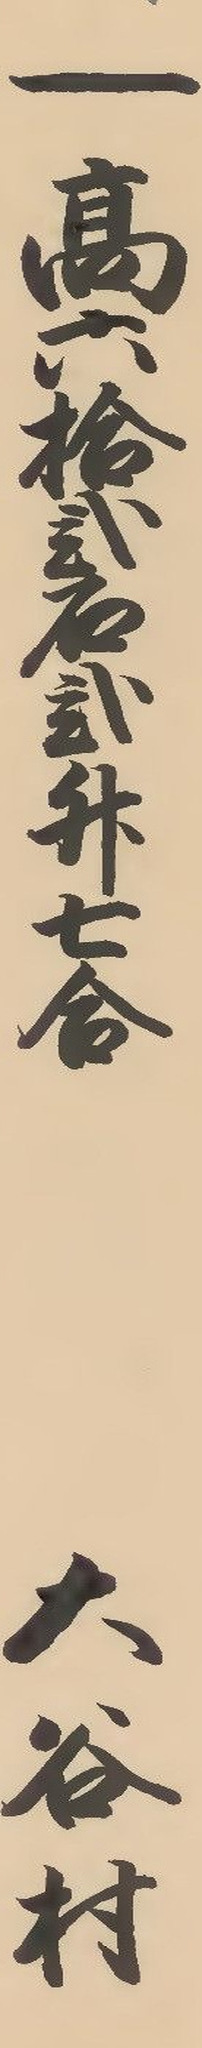一高六拾弐石弐升七合大谷村
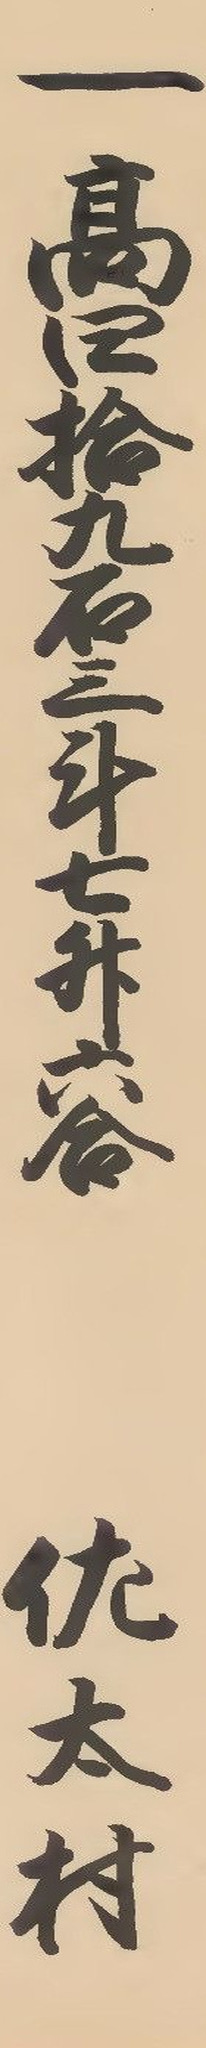一高四拾九石三斗七升六合佐太村
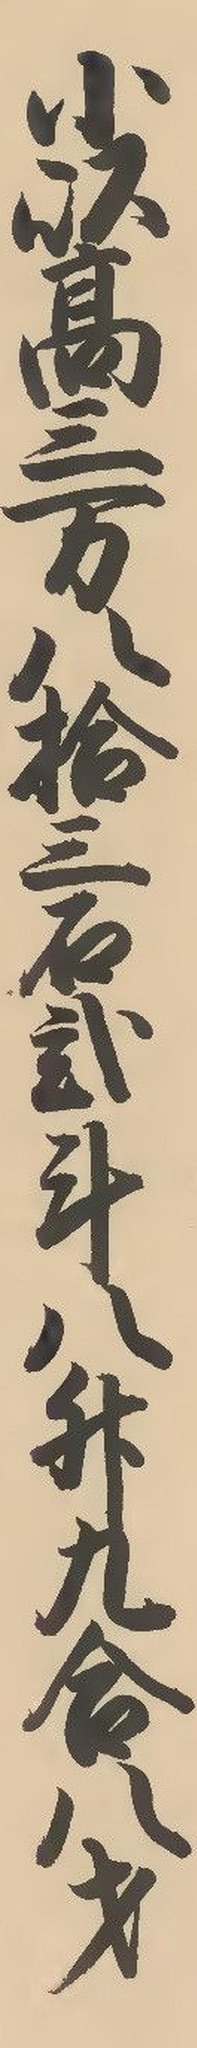小以高三万八拾三石弐斗八升九合八才
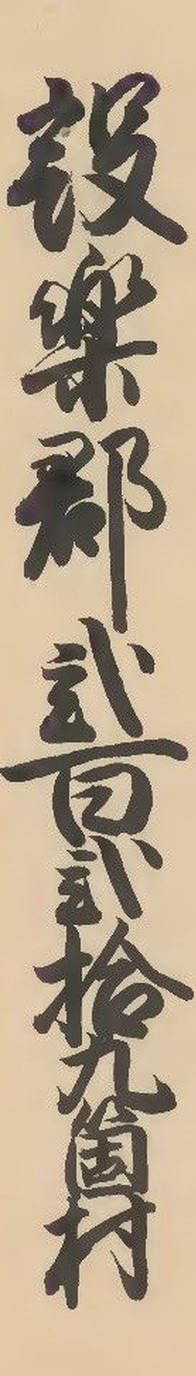設楽郡弐百弐拾九箇村

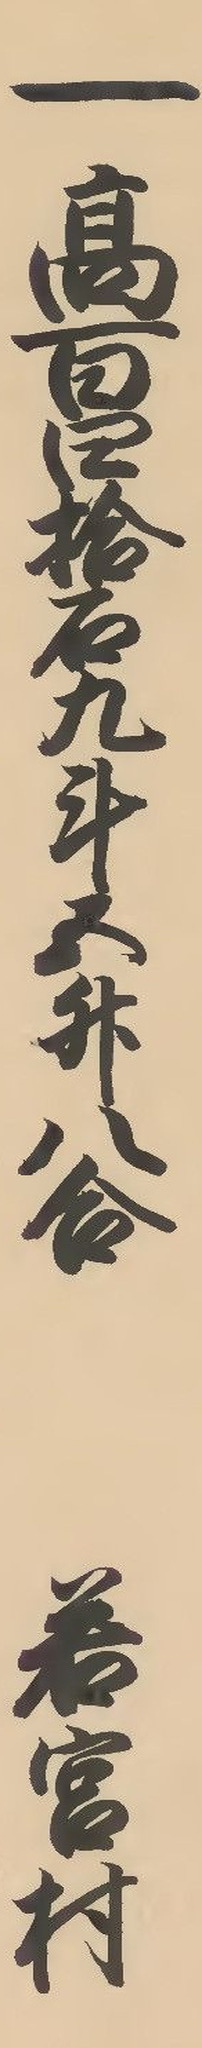一高百四拾石九斗五升八合若宮村
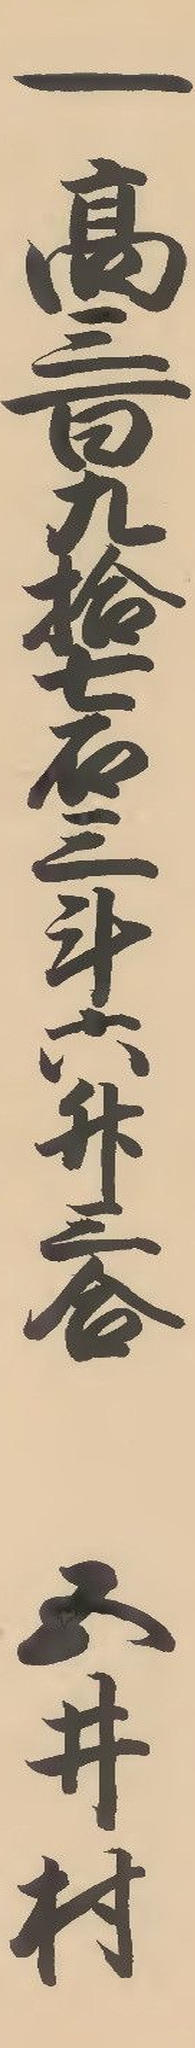一高三百九拾七石三斗六升三合五井村
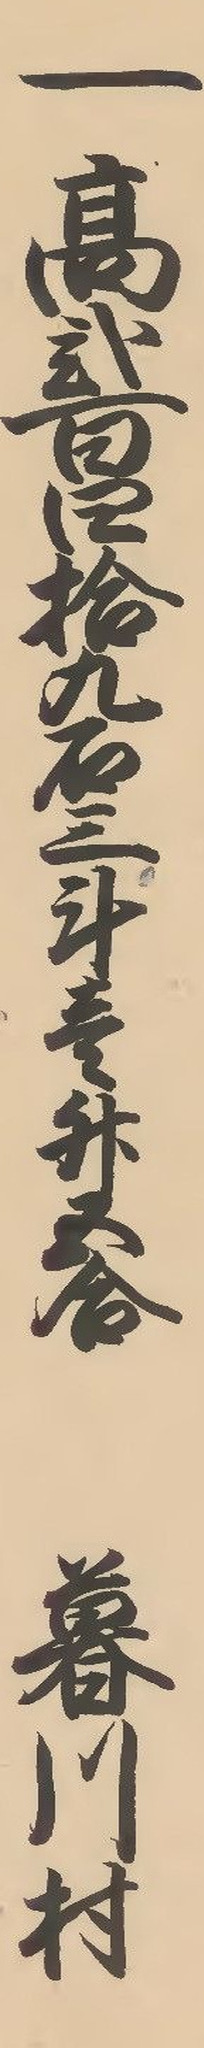一高弐百四拾九石三斗壱升五合暮川村
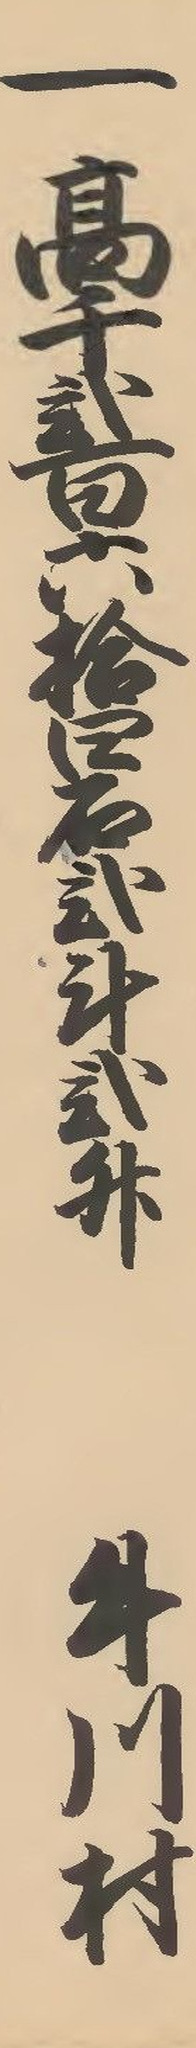一高千弐百六拾四石弐斗弐升牛川村
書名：三河国郷帳
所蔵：国立公文書館 National Archives of Japan
